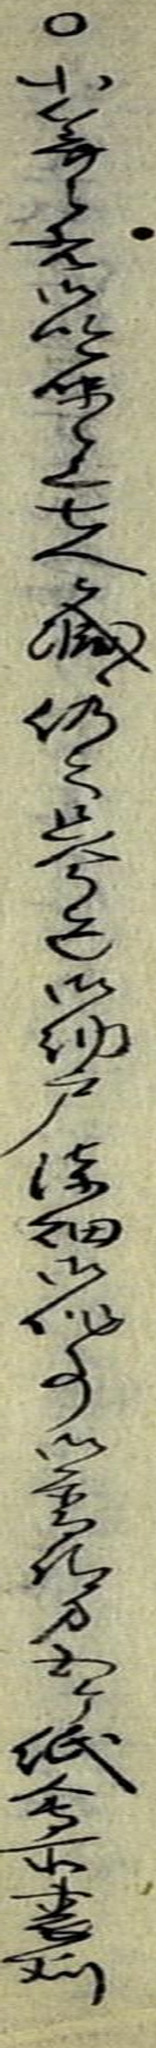〇小算之者御吟味之上七人被減候仍之只今迄御納戸漆畑御作事御普請方五ケ紙会所裏判
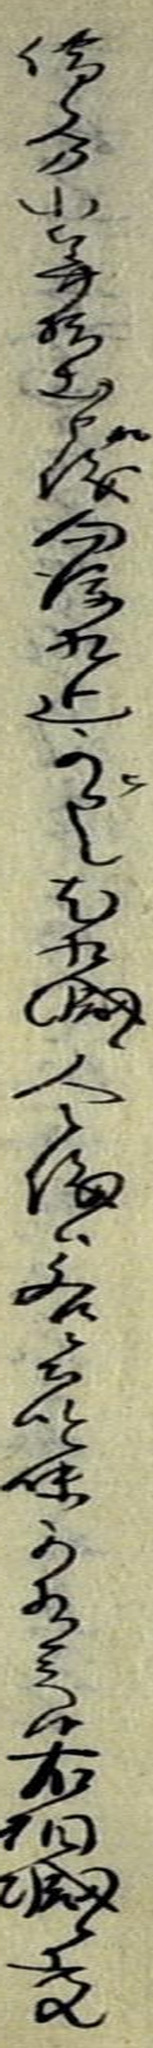借候分小算指出申候儀向後相止可被申候尤相減候人之儀ハ各ニ御吟味可有之候右相減候者共
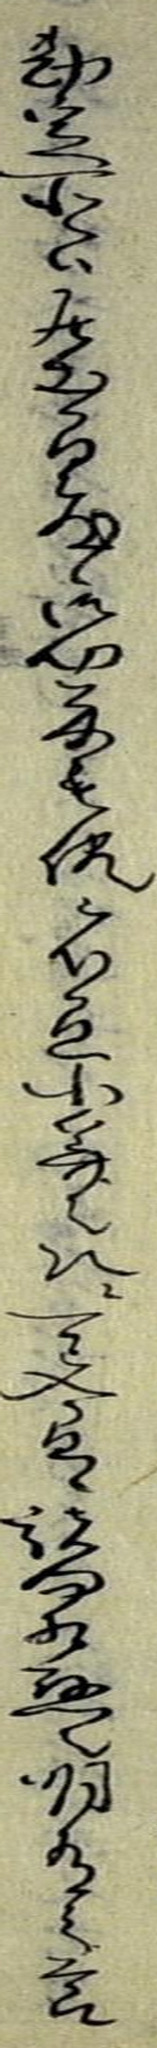勘定所ヘハ罷出間敷候御切米其儘被下置小算之次ニ可被入置候諸向相応之明有之節
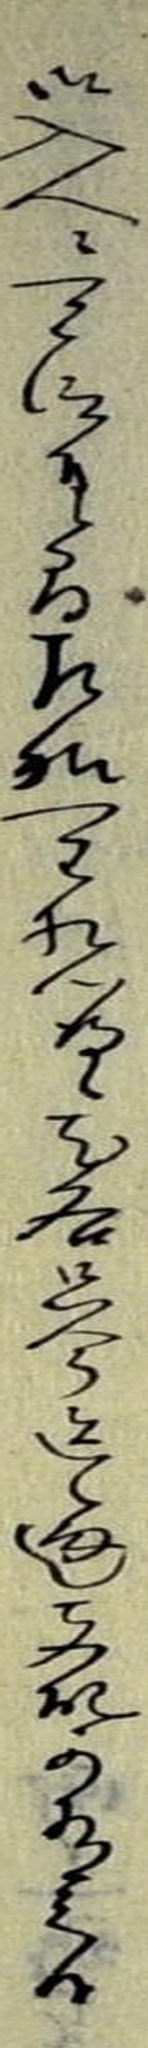御入人ニ可被仰付候間左様可被相心得候尤各只今迄之通支配可有之候
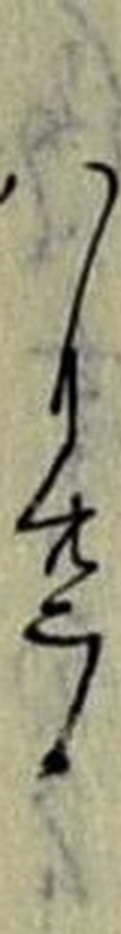八月廿二日
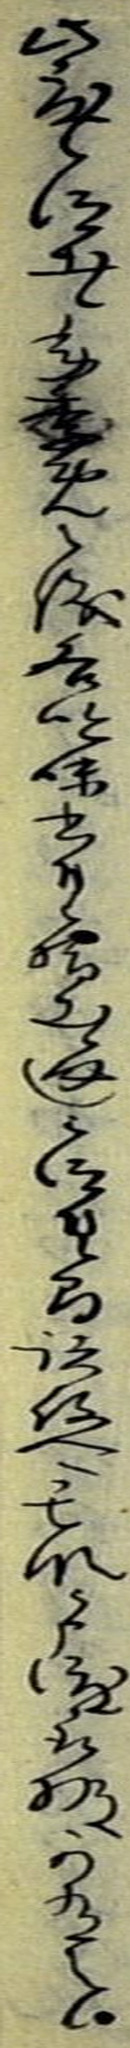〇此度被仰出候年季免之儀各吟味書付被指出候通被仰付候間諸役人へ其段被申渡取扱可有之候
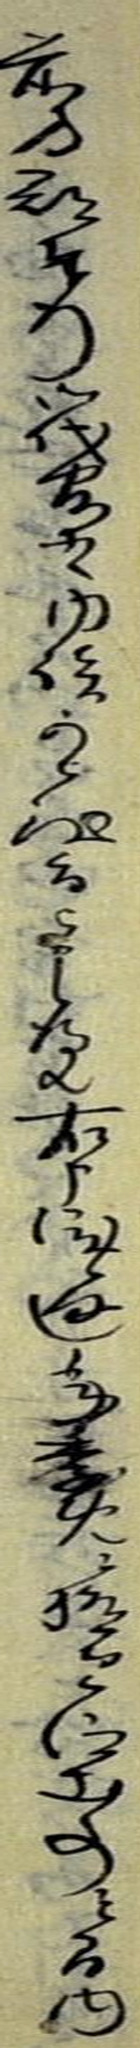前方郡奉行御代官等へ内談可被致旨被申候得共右申渡候通年季免ニ極而被仰出事ニ候間内
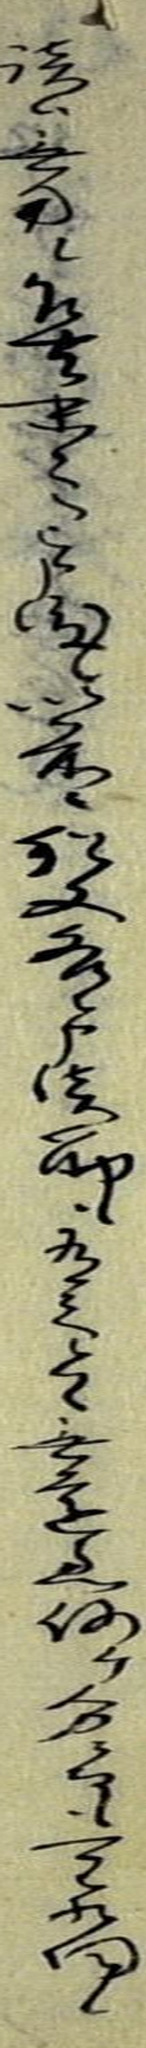談ハ無用候乍去末々へ被申渡候以前ニ猶又各被申談筋も有之候ハヽ無遠慮何ケ分ニ而も可被相伺候
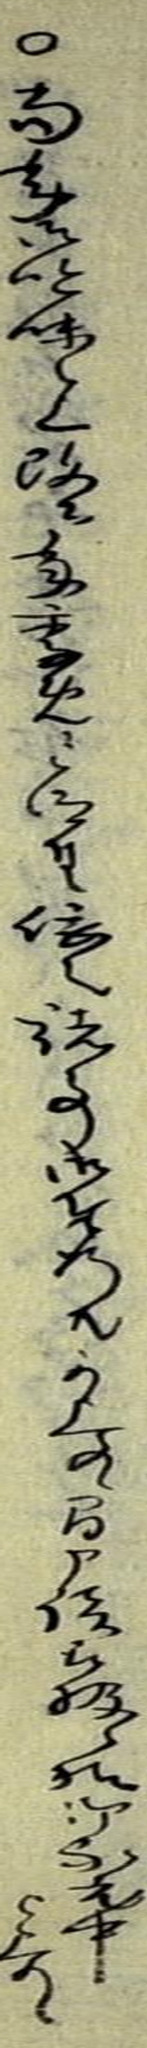〇当年御吟味之上改而年季免ニ被仰付候依之諸事御奉行共可申聞候間申談取扱候様御家老中被申聞候
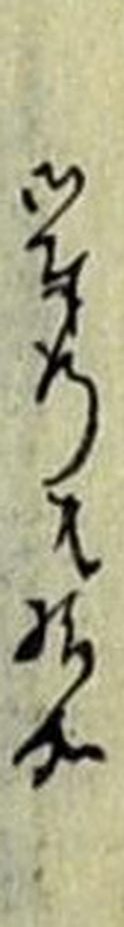御奉行共指加
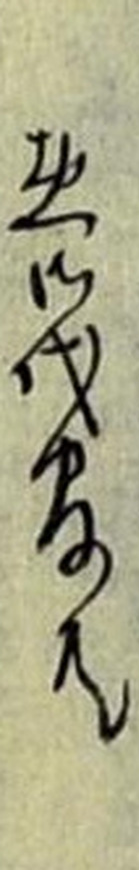惣御代官共
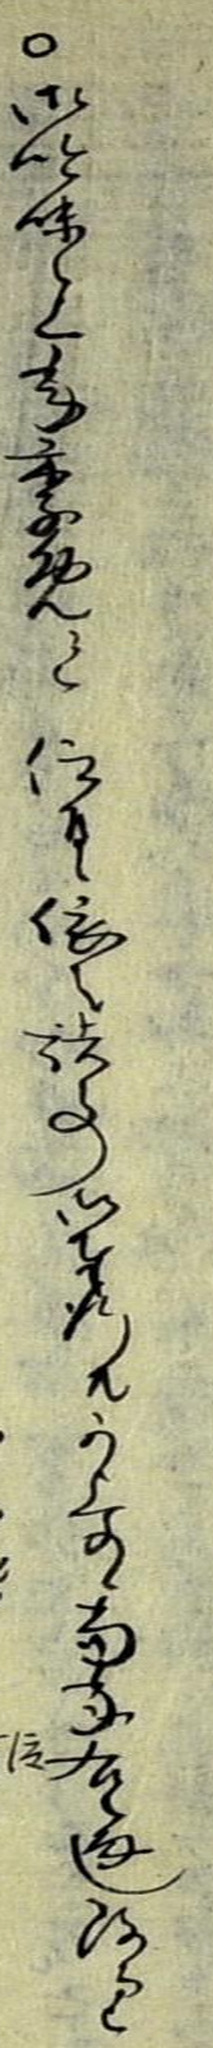〇御吟味之上年季免ニ被仰付候依之諸事御奉行共可申聞候当年右之通改而被
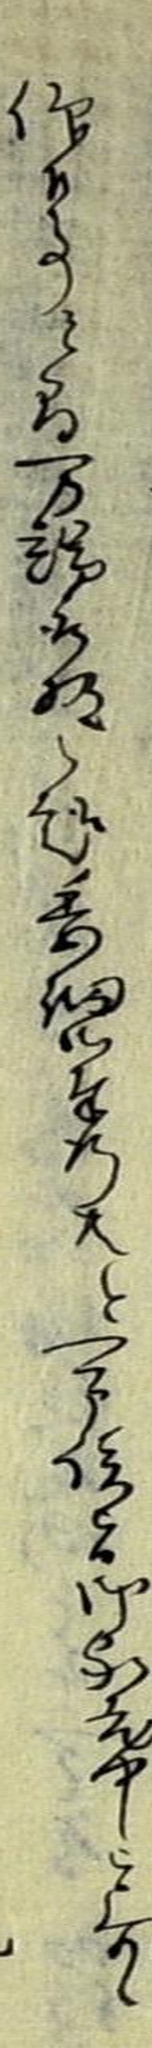仰下事ニ候間万端取扱候趣委細御奉行共と可申談旨御家老中被申聞候
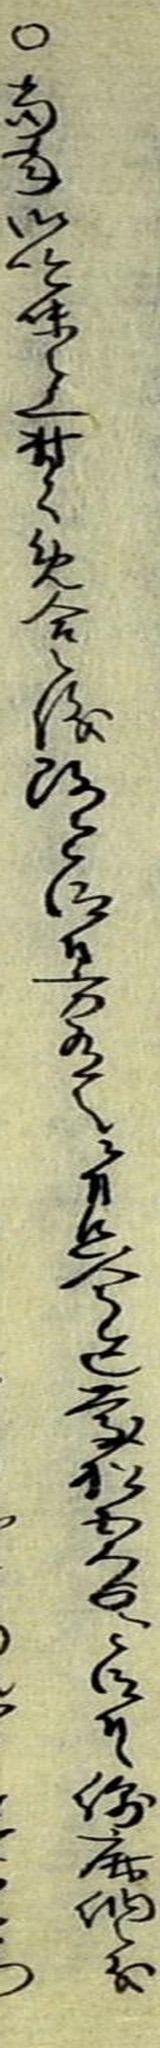〇当年御吟味之上村々へ免合之儀改而被仰付方有之ニ付只今迄慶松五右衛門へ被仰付候綿麻納之義
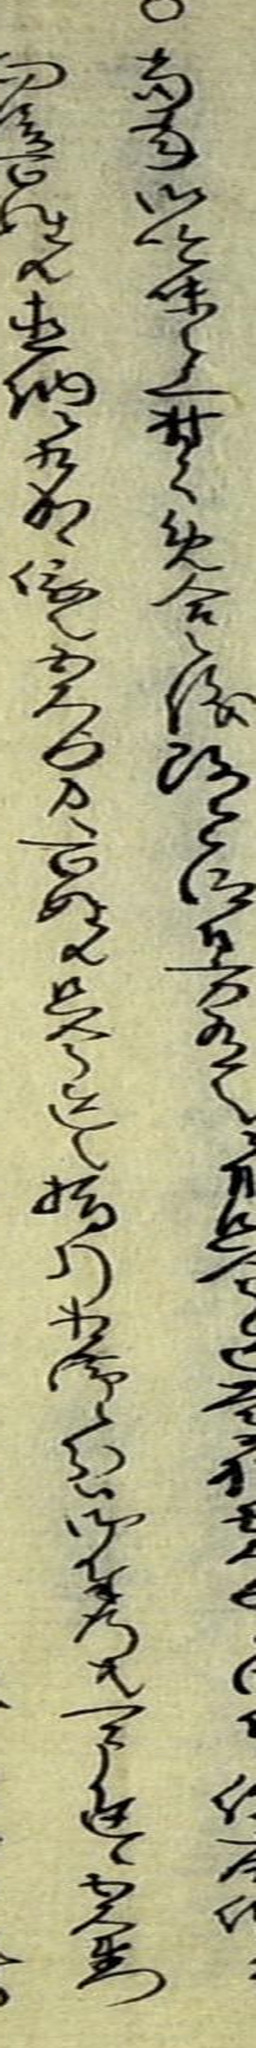向後百姓共直納ニ相成候依之五右衛門方へ百姓共只今迄之指引相滞候分ハ御奉行共可申達候五右衛門
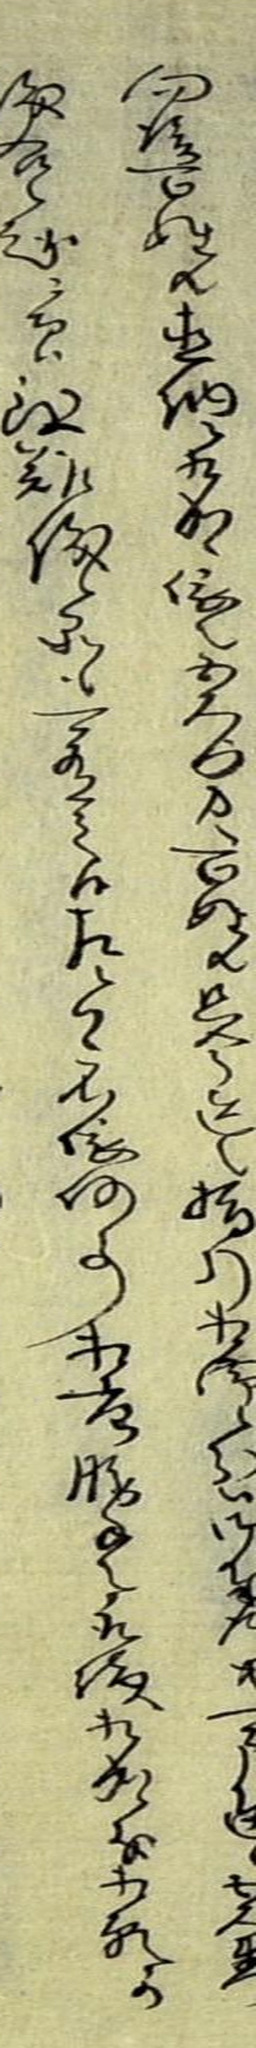儀右之趣ニ而ハ致難儀候品も可有之候左候ハヽ不依何事相勝手之取続相成候義相願可
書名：命令之部 一
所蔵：福井県文書館 Fukui Prefectural Archives
